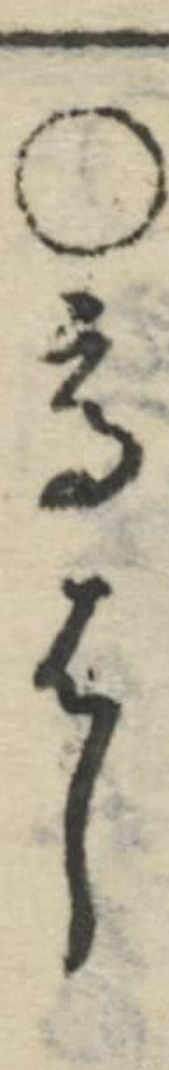○高はし
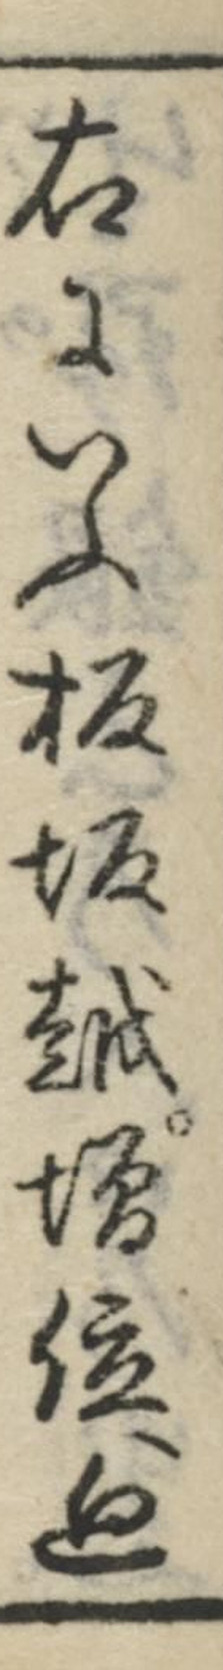右にいふ板坂越。増位へ廻
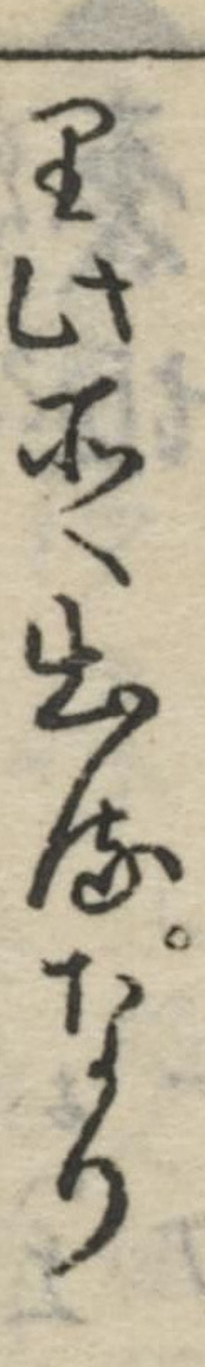り此所へ出る。なり
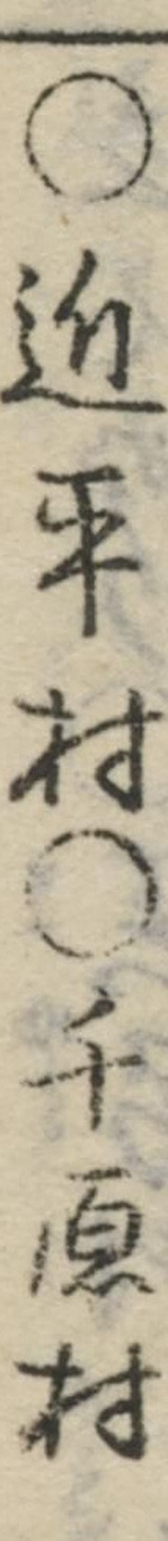○近平村○千原村
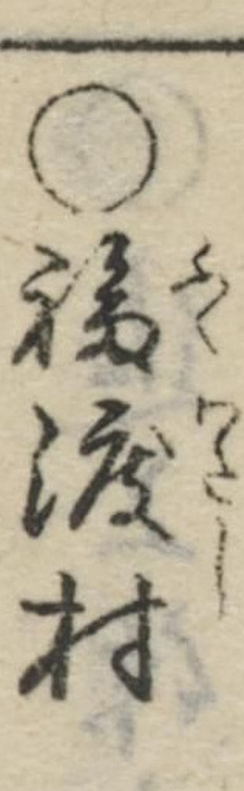○福渡村
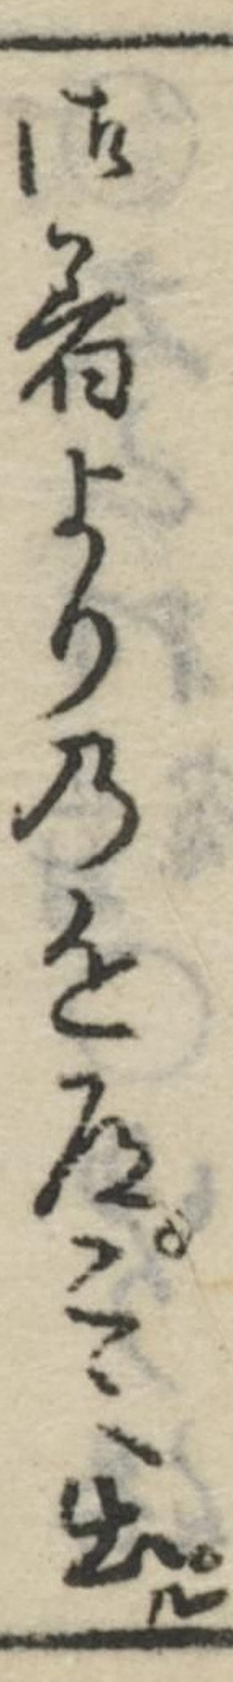御着よりの近道。こゝへ出る。
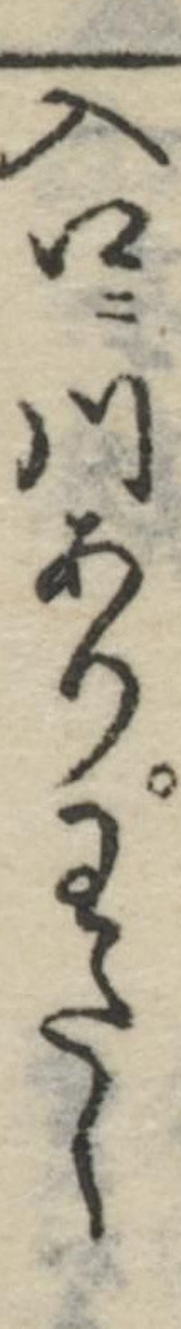入口に川あり。わたし
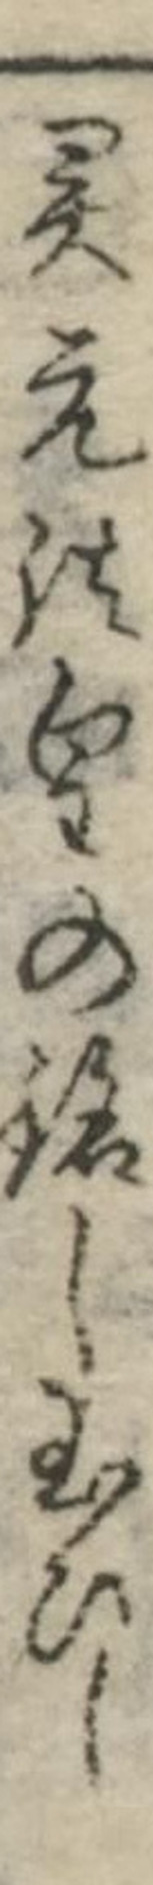霊元法皇の銘し玉ひし
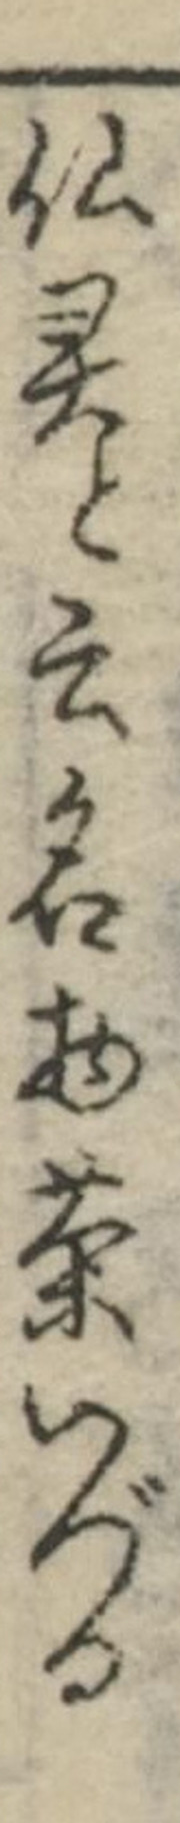仙霊と云名物茶いづる

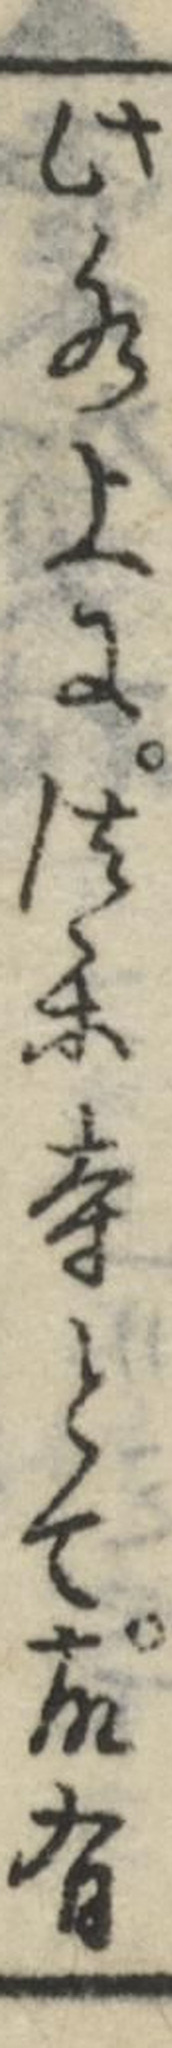此水上に。法楽寺とて。故有
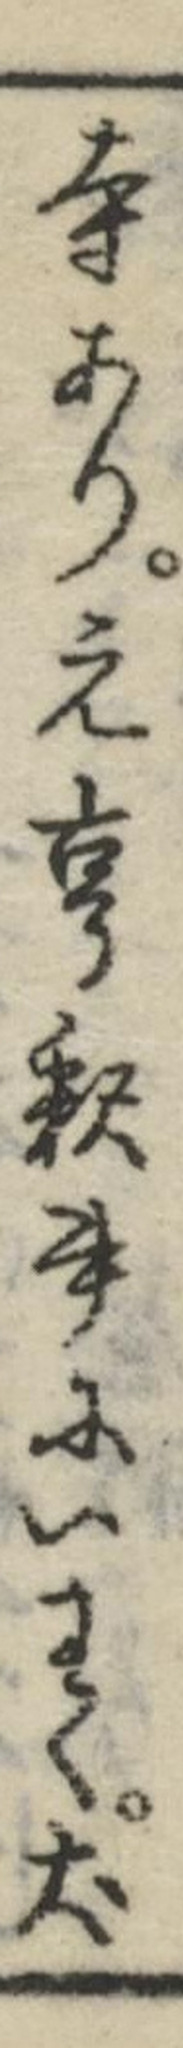寺あり。元享釈書にいわく。犬
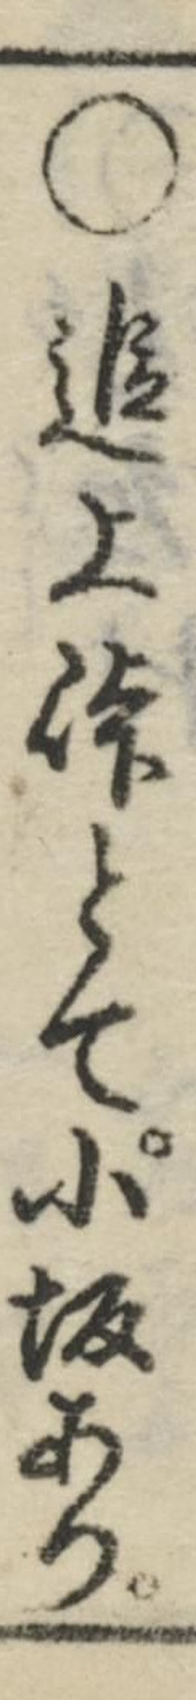○追上峠とて。小坂あり。
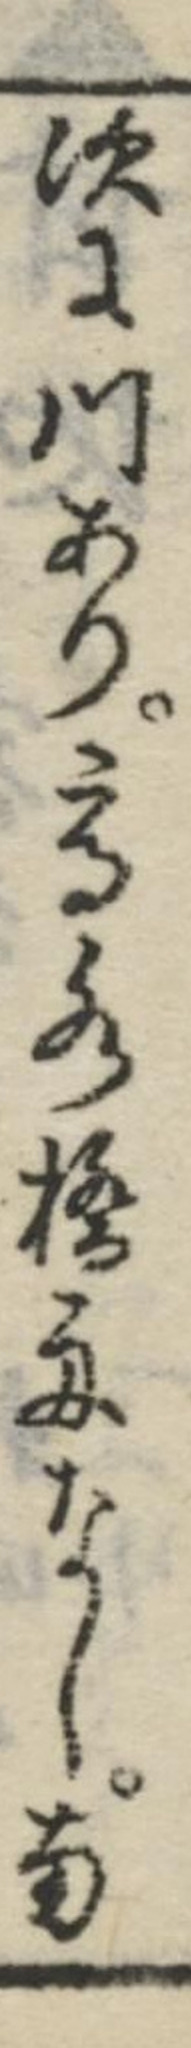次に川あり。高水橋舟なし。南
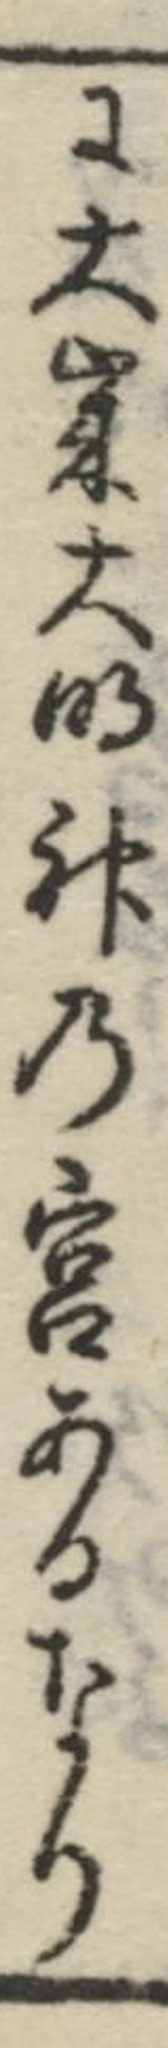に大歳大明神の宮あるなり
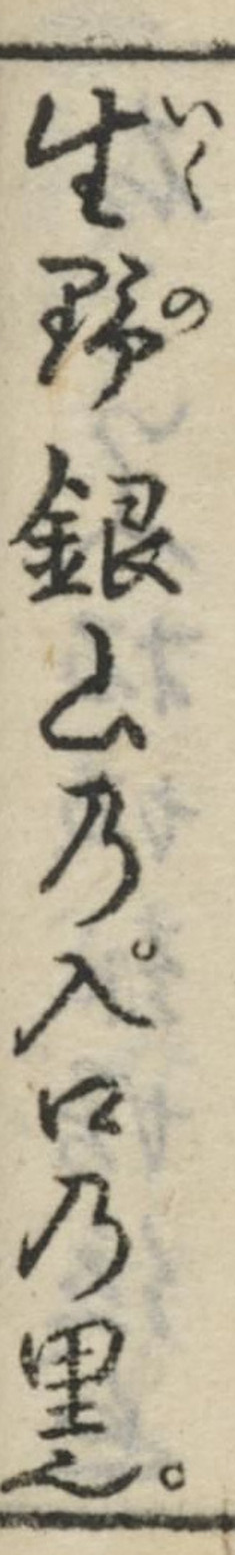生野銀山の。入口の里也。
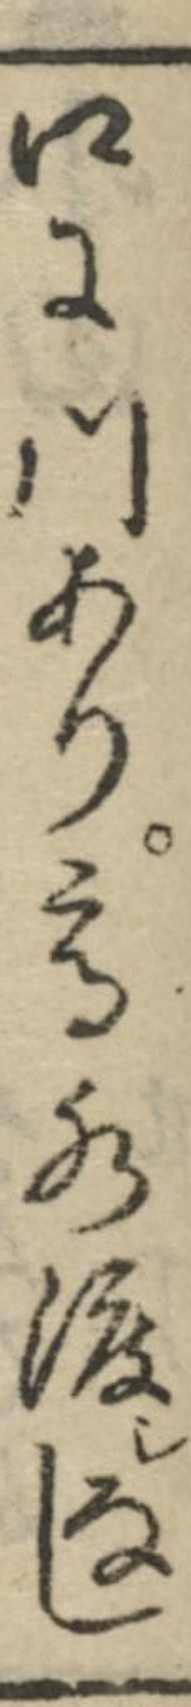口に川あり。高水渡しなし
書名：但州城崎浴湯辧
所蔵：東京大学地震研究所図書室 Earthquake Research Institute Library, The University of Tokyo, JAPAN
